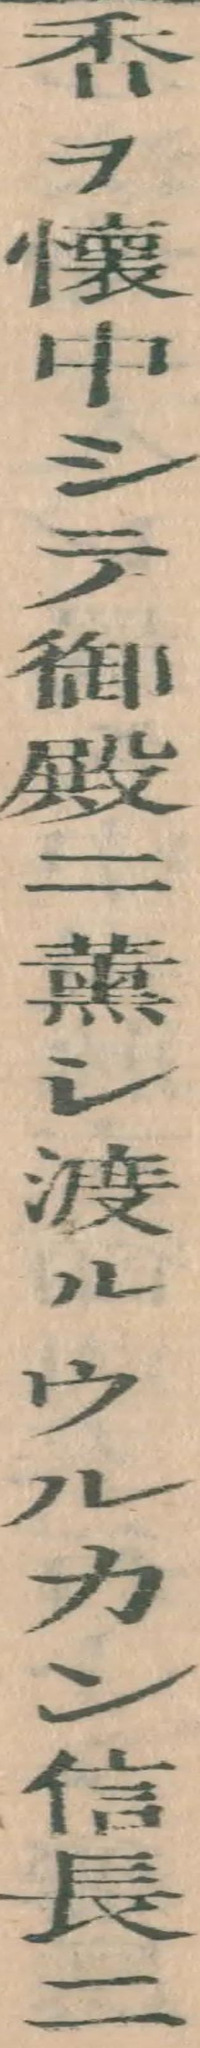香ヲ懐中シテ御殿ニ薫シ渡ルウルカン信長ニ
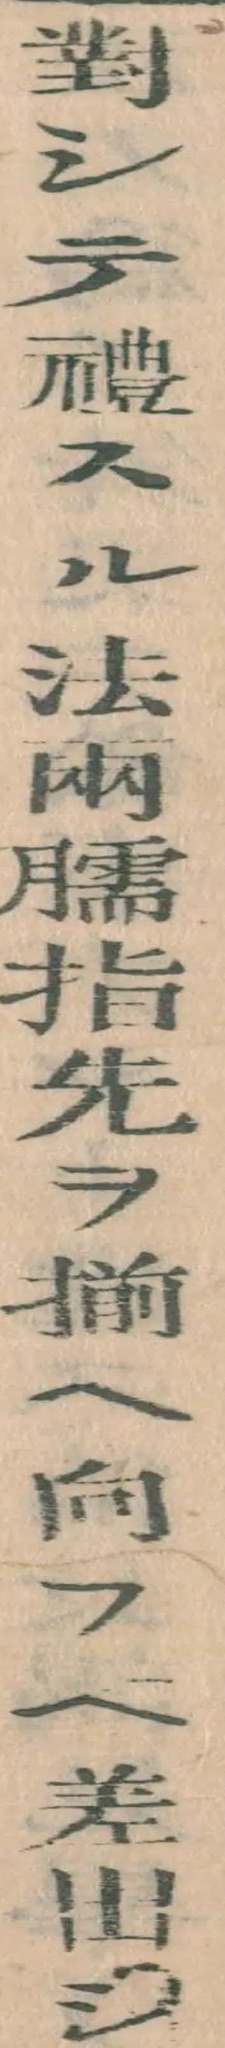対シテ礼スル法両臑指先ヲ揃ヘ向フヘ差出シ
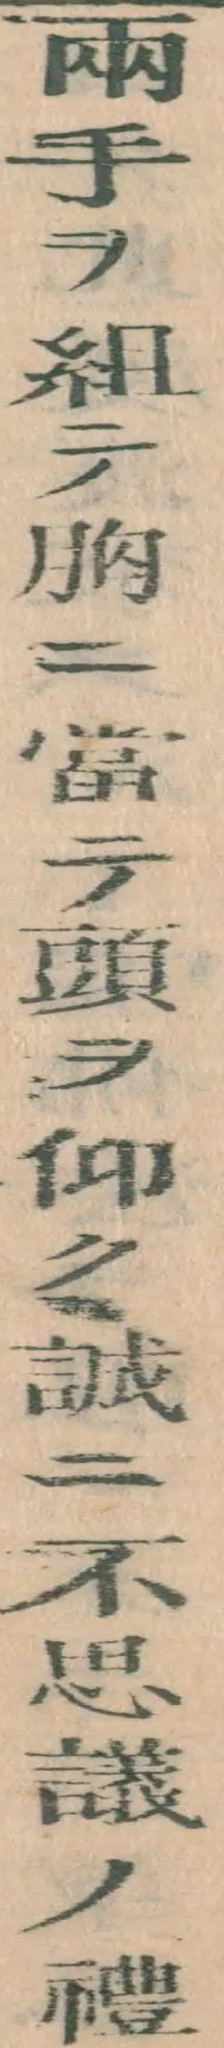両手ヲ組テ胸ニ当テ頭ヲ仰ク誠ニ不思議ノ礼
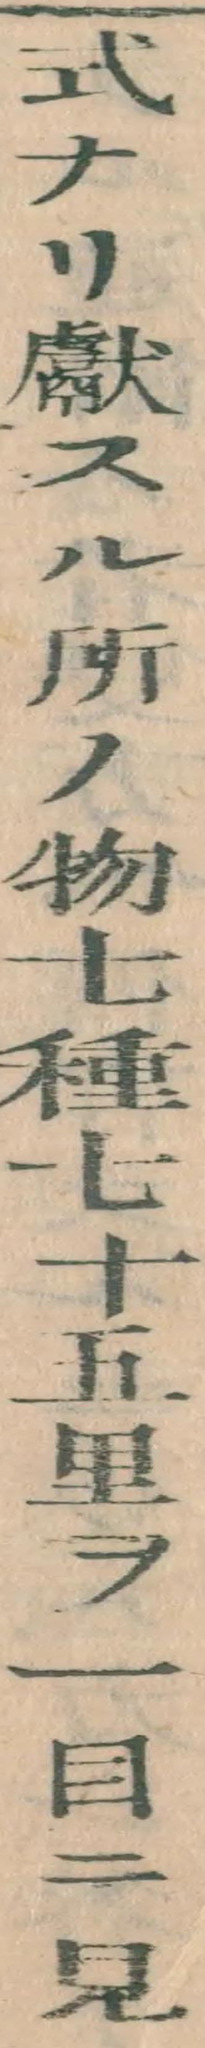式ナリ献スル所ノ物七種七十五里ヲ一目ニ見
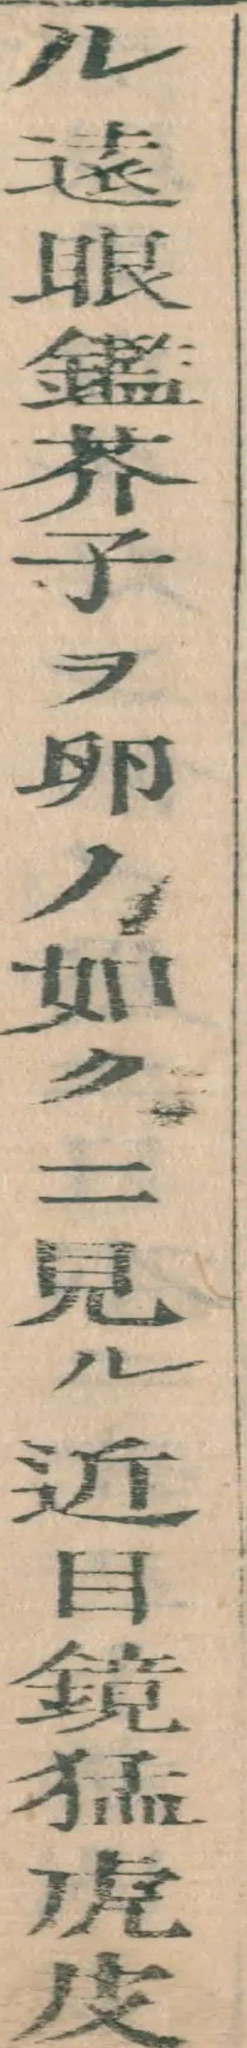ル遠眼鑑芥子ヲ卵ノ如クニ見ル近目鏡猛虎皮
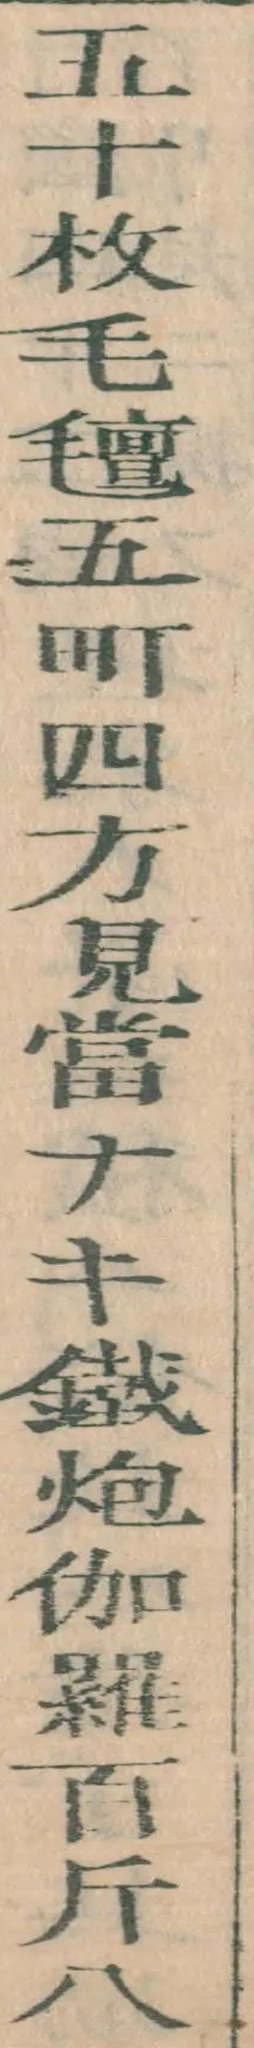五十枚毛氊五町四方見当ナキ鉄炮伽羅百斤八
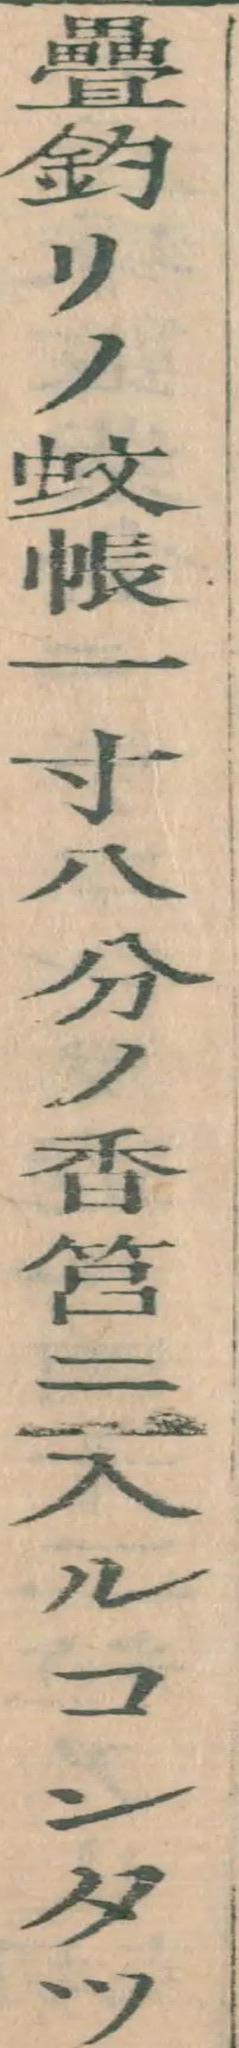畳釣リノ蚊帳一寸八分ノ香筥ニ入ルコンタツ

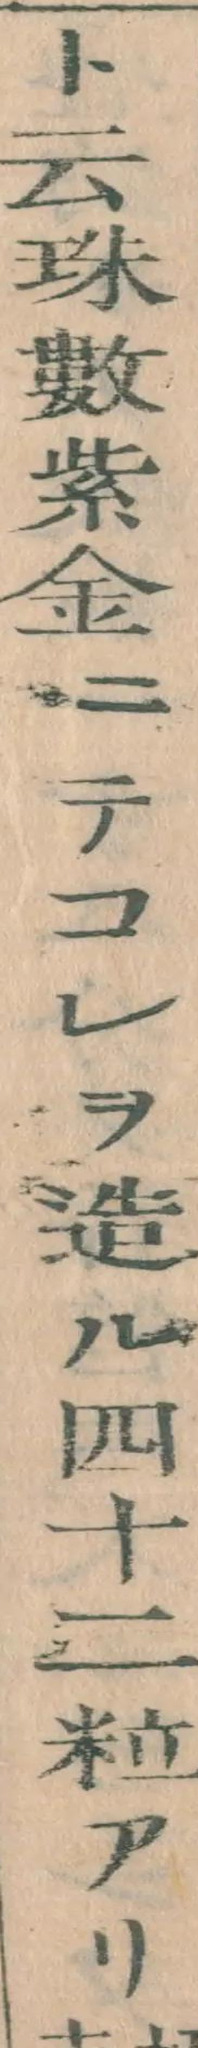ト云珠数紫金ニテコレヲ造ル四十二粒アリ切支
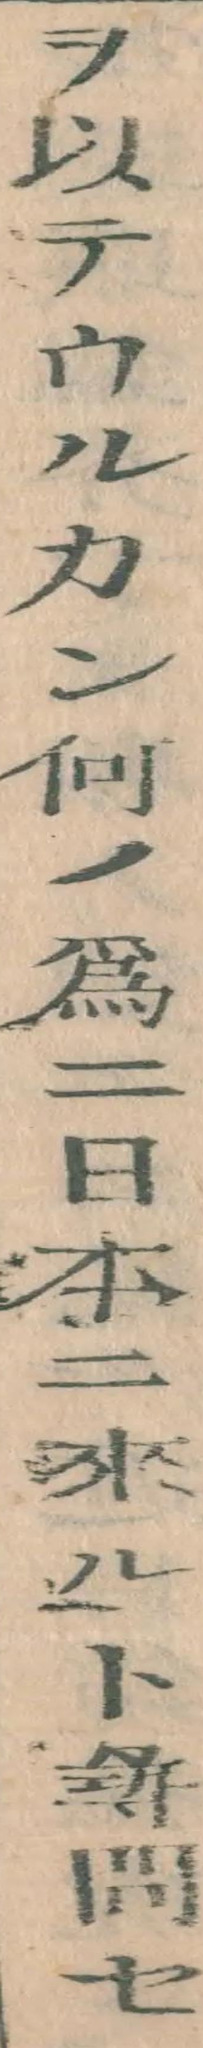ヲ以テウルカン何ノ為ニ日本ニ来ルト尋問セ
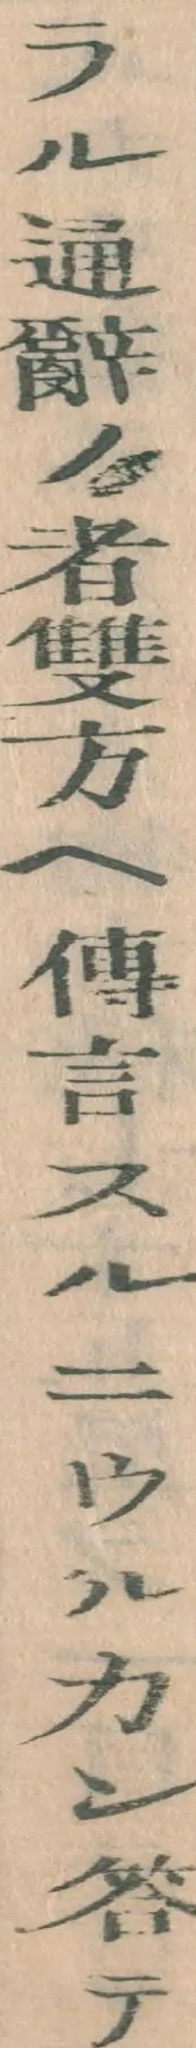ラル通辞ノ者双方ヘ伝言スルニウルカン答テ
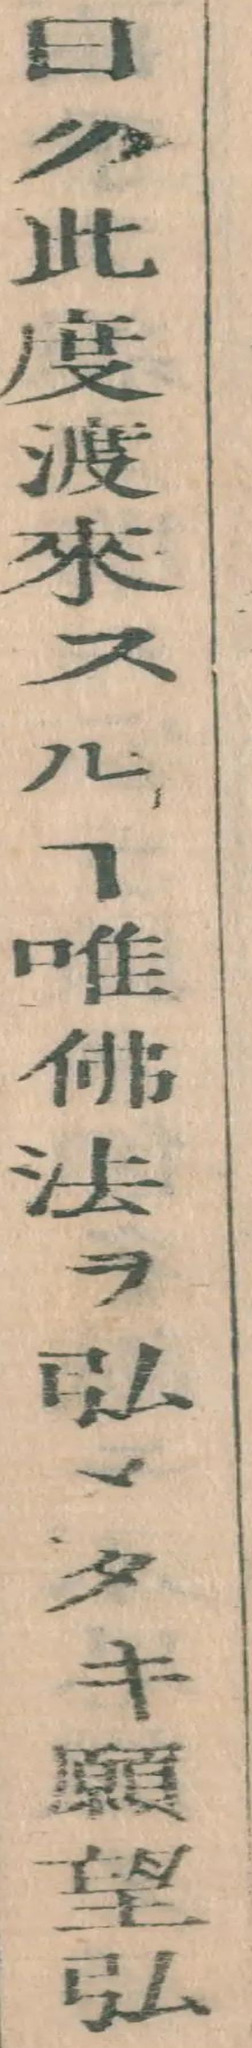曰ク此度渡来スルヿ唯仏法ヲ弘メタキ願望弘
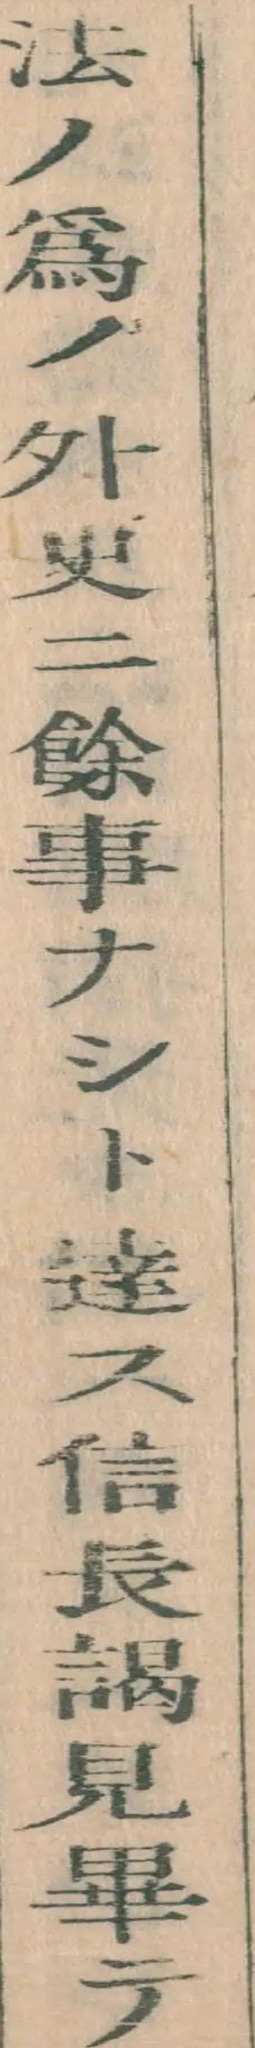法ノ為ノ外更ニ余事ナシト達ス信長謁見畢テ
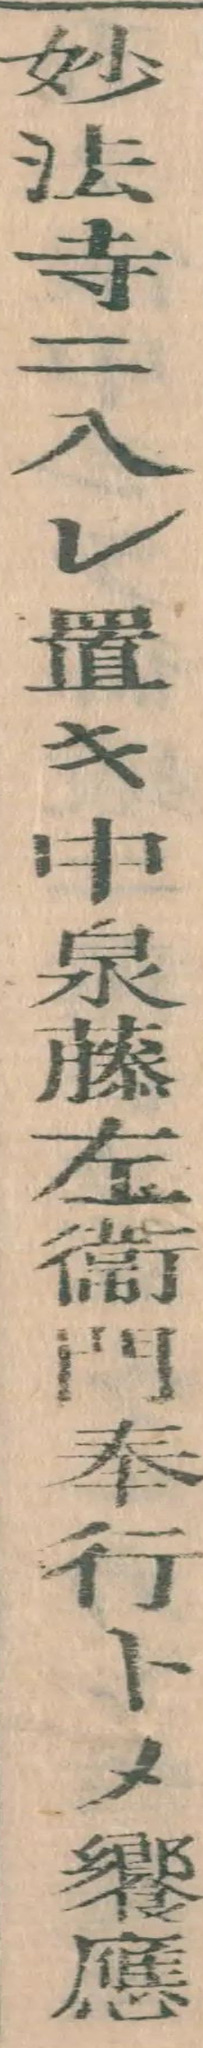妙法寺ニ入レ置キ中泉藤左衛門奉行トメ饗応
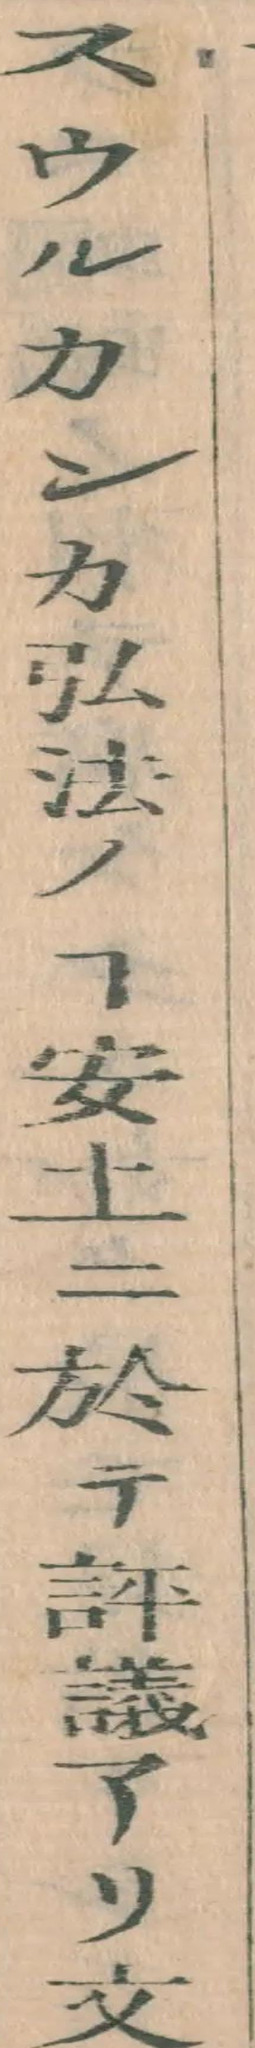スウルカンカ弘法ノヿ安土ニ於テ評議アリ文
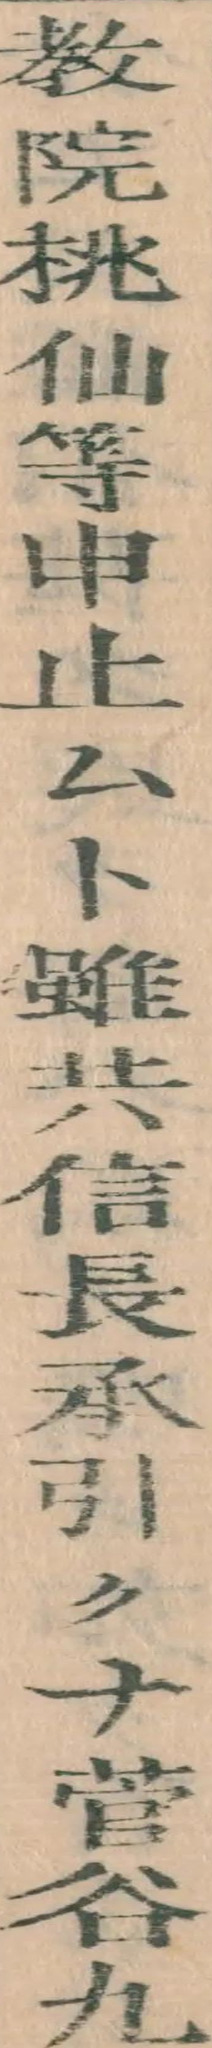教院桃仙等申止ムト雖共信長承引クナ菅谷九
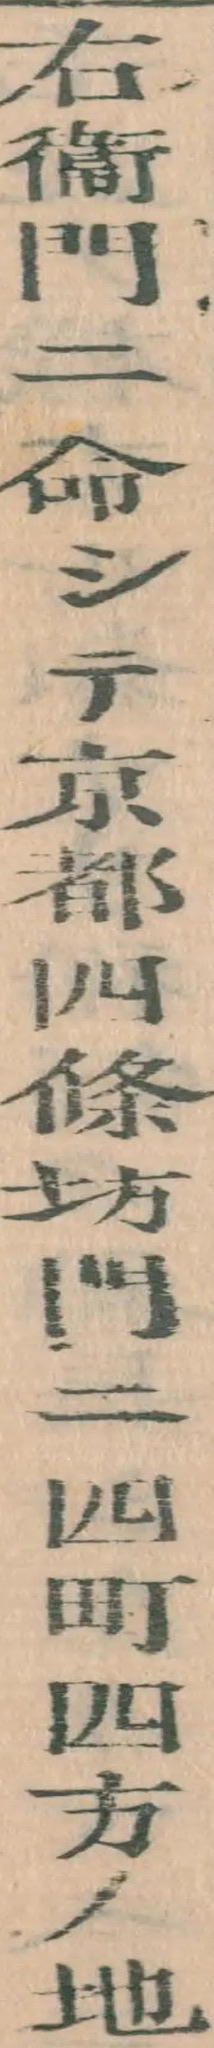右衛門ニ命シテ京都四条坊門ニ四町四方ノ地
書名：南蛮寺興廃記
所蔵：国立国会図書館 National Diet Library, JAPAN
